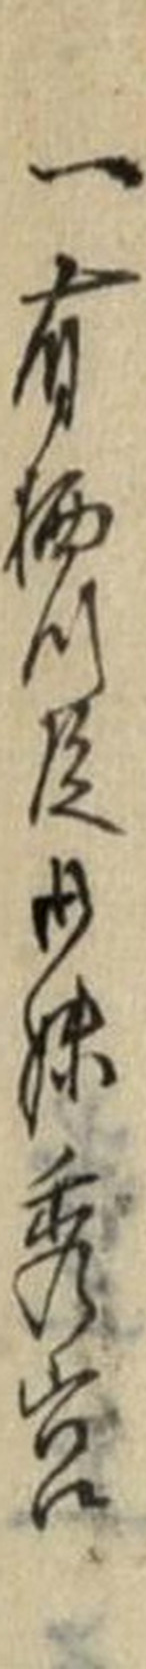一有栖川殿御妹秀宮
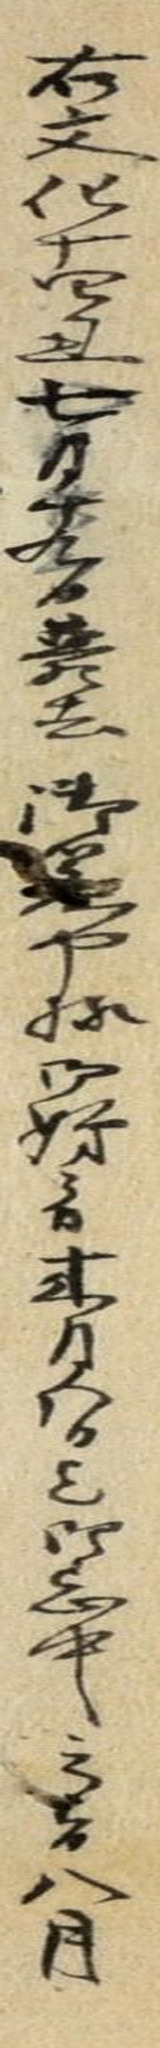右文化十四丑七月十九日薨去御簾中様御姉に付来月八日迄御忌中之旨八月
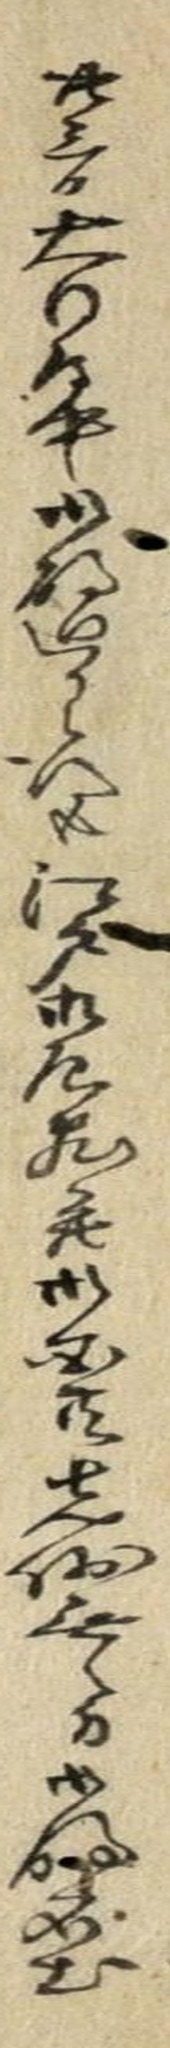廿三日大目付中御触廻り候得共江戸御屋敷并御国共先例無之付御触不出
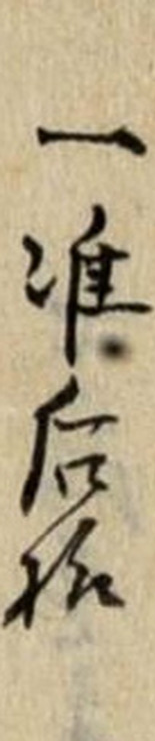一准后様
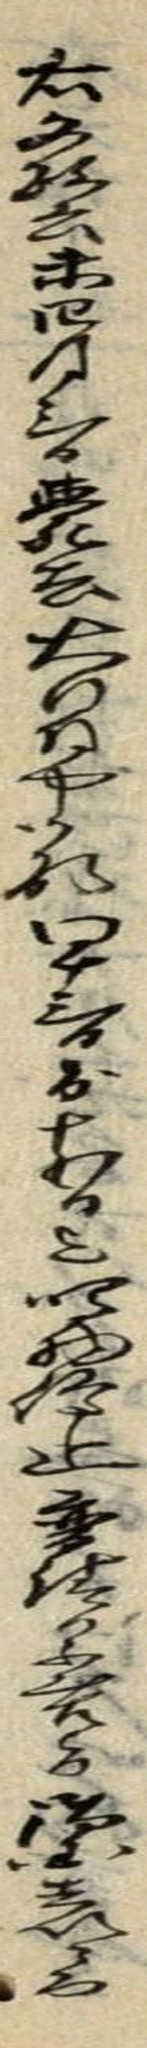右文政六未四月三日薨去大目付中御触同十三日ゟ十五日迄鳴物停止普請は不苦旨御国表にて
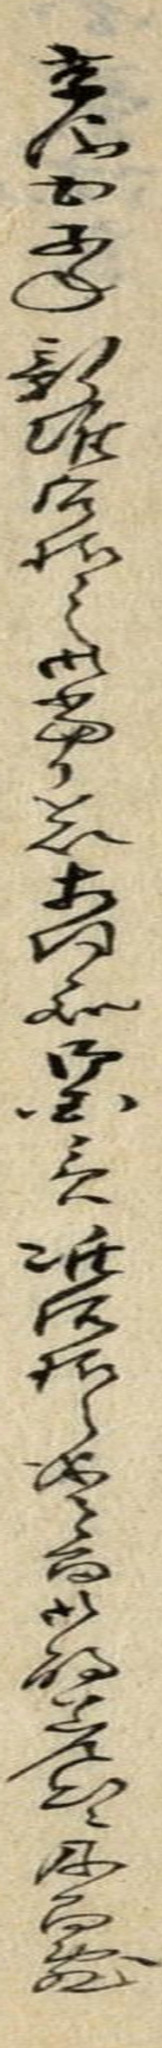享保五子年新准后様之御当りを以相伺候処御国にては准后様之義に候間御触差出に及間敷
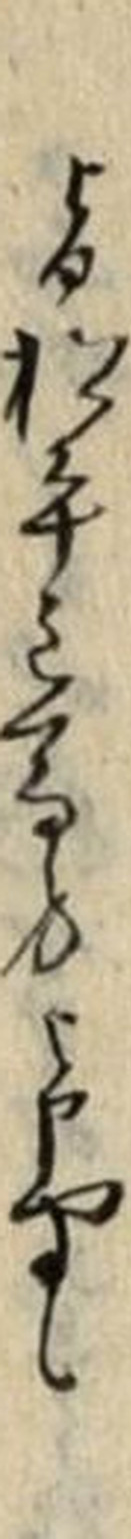旨松平主馬方被申聞候
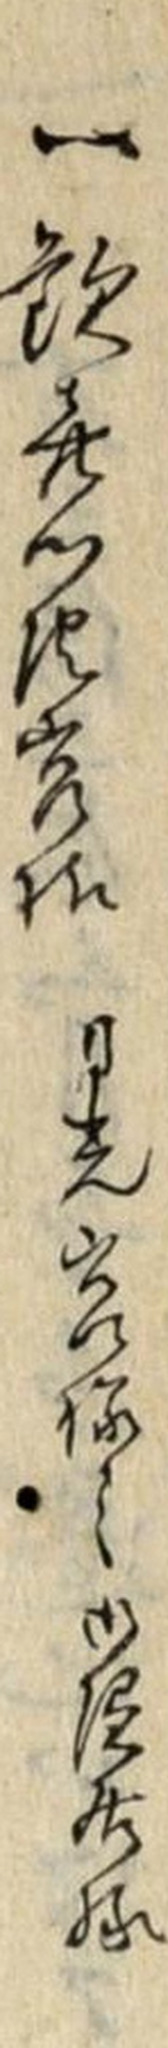一歓喜心院宮様日光宮様之御隠居様
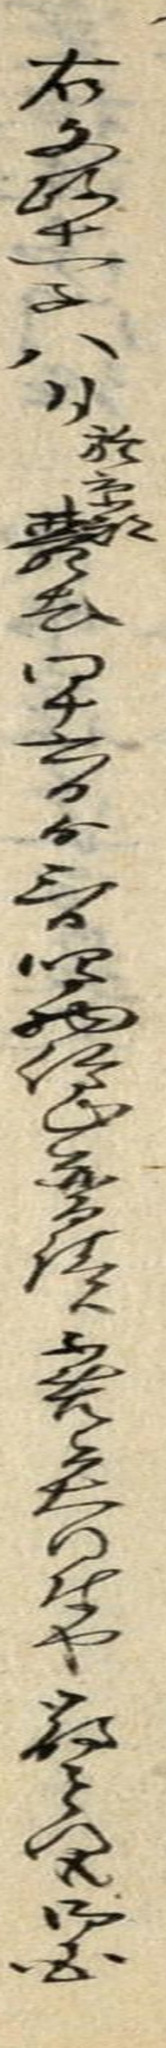右文政十一子八月於京都薨去同十六日ゟ三日鳴物停止普請は不苦旨大目付中御触に候得共御国
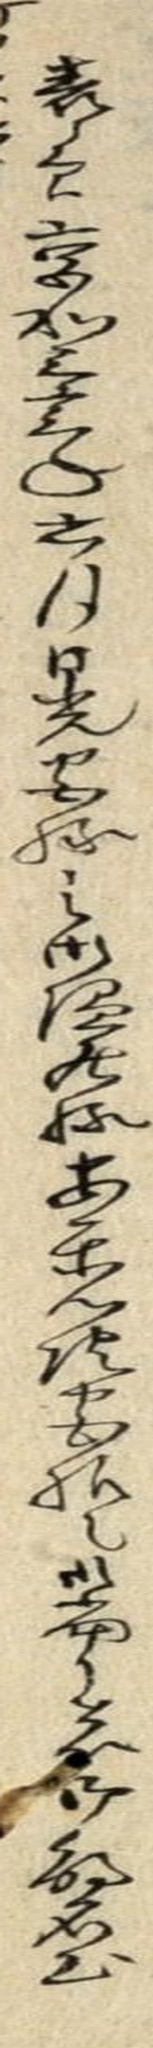表にては享和三亥年六月日光宮様之御隠居様安楽心院宮様の御当りを以御触不出
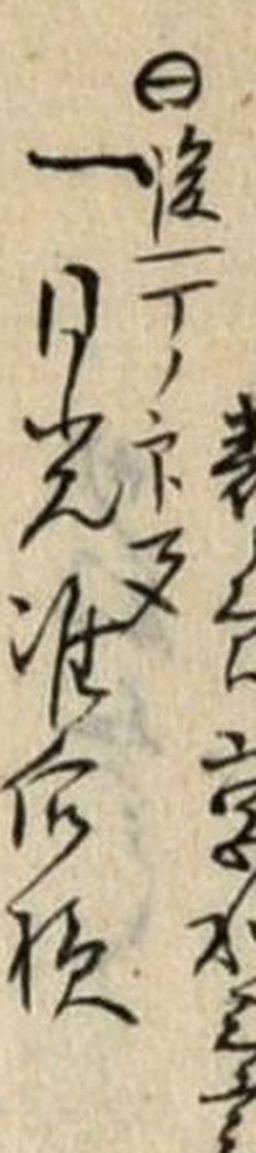一日光准后様
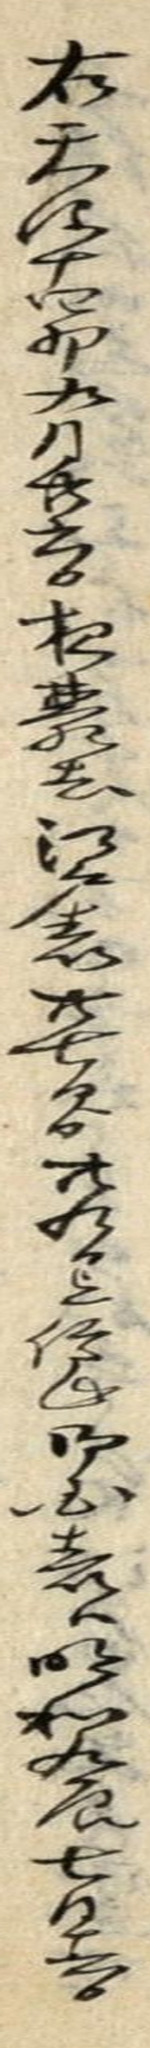右天保十四卯九月廿六日夜薨去江戸表廿七日ゟ廿九日迄停止御国表は明和九辰七月十六日
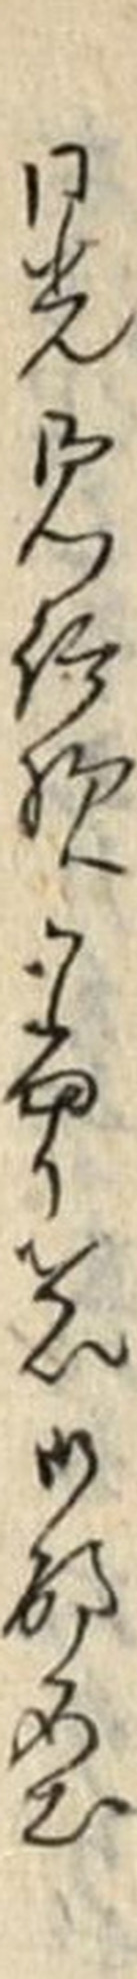日光御門跡様御当りを以御触不出
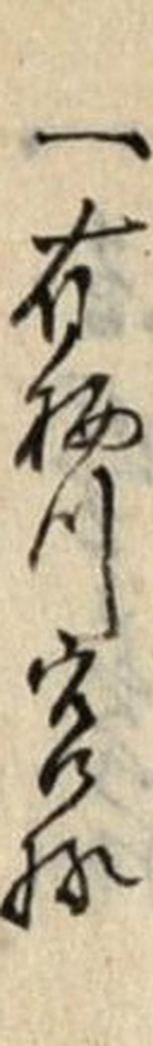一有栖川宮様
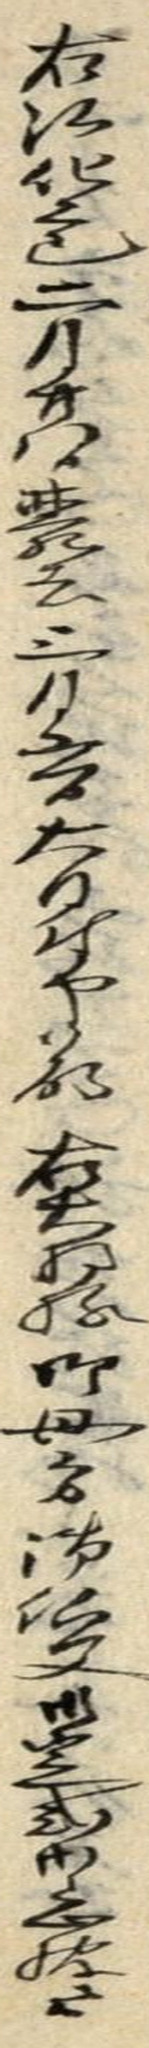右弘化二巳二月廿八日薨去三月六日大目付中御触右大将様御母方御伯父御定式御忌服にて
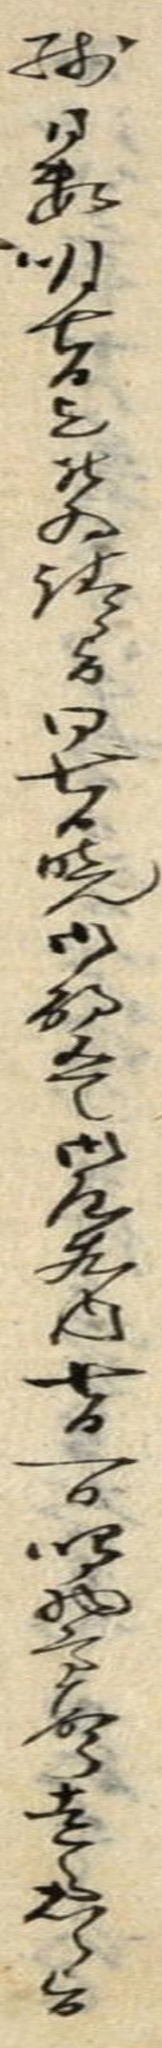残日数明七日迄被為請候旨同七日暁御触有之御屋敷内七日一日鳴物高声遠慮之旨
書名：御停止異変死失
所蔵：福井県文書館 Fukui Prefectural Archives
